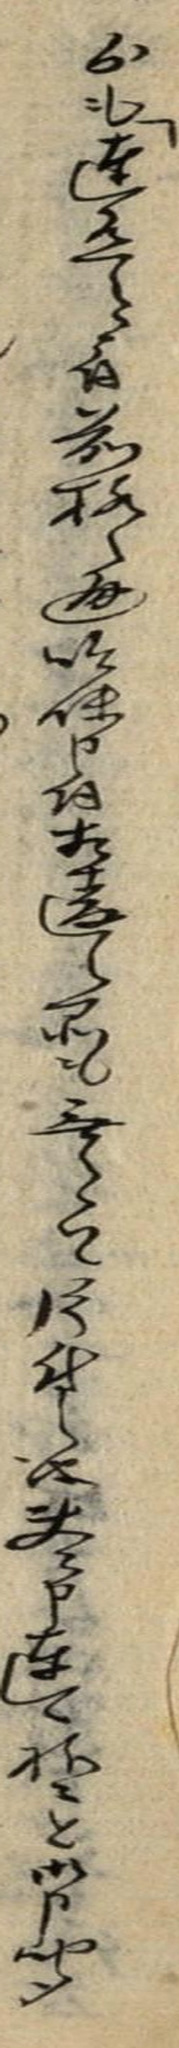ゟも「達有之候に付前格之通吟味申付相違之品も無之候はゝ片付之儀夫々申達候様にと御申聞
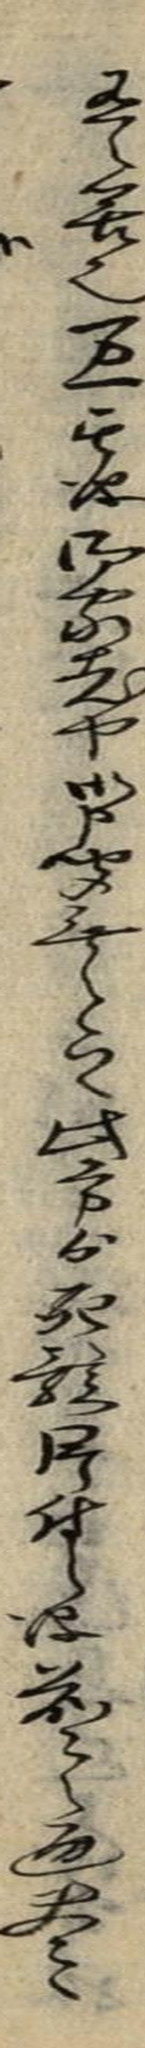有之筈也万一其儀御家老中御申聞無之候はゝ此方ゟ死骸片付之儀前々之通夫々へ
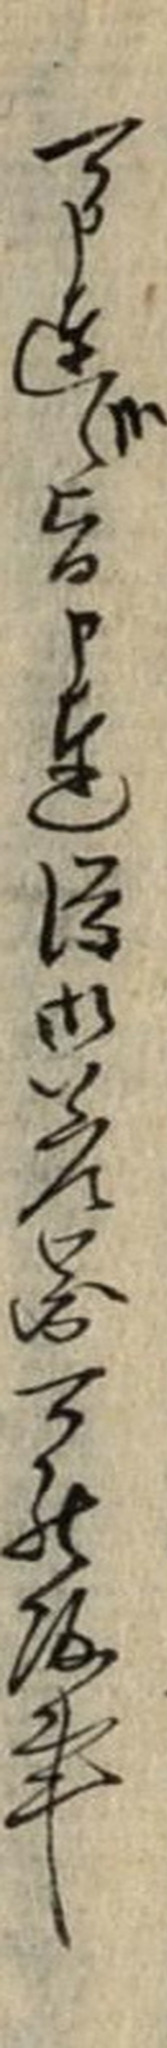可申達哉之旨申達得御差図可罷帰事
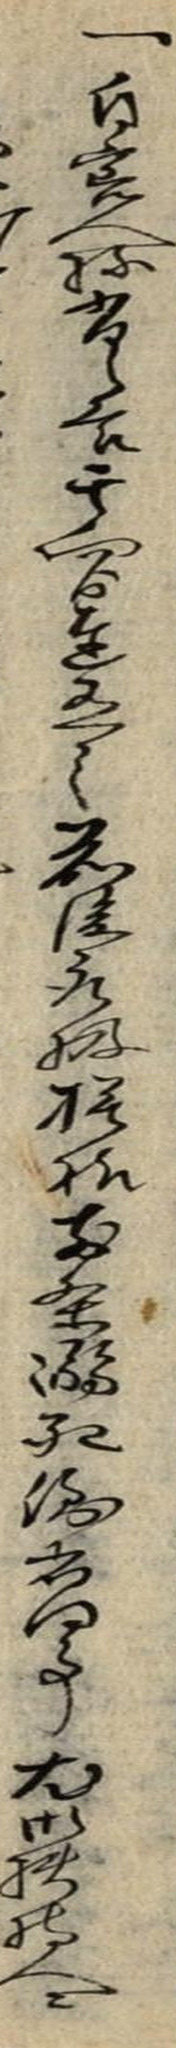一自害人抔有之節其向ゟ達有之前後取扱模様前条溺死倒者同事尤御扶持人に
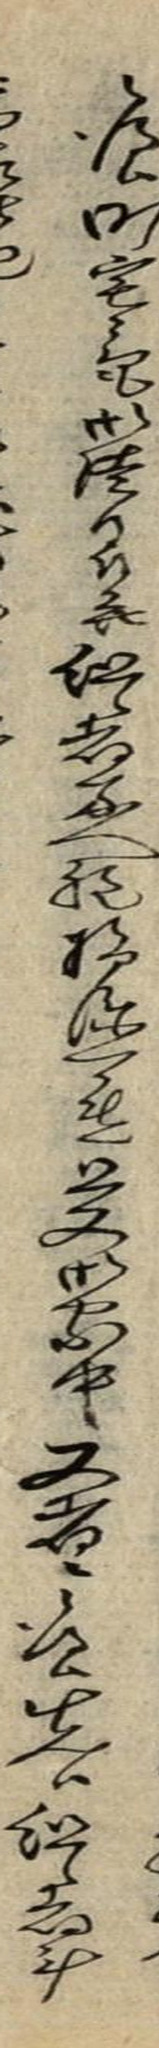候得は町宅にても御徒目付并組之者両人程指添可遣且又御家中又者に候得は先は組之者斗
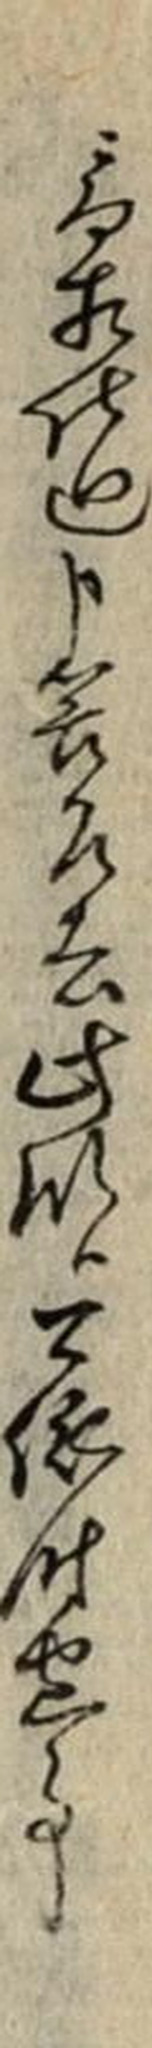にて相仕廻申筈乍去此段は可依時宜事
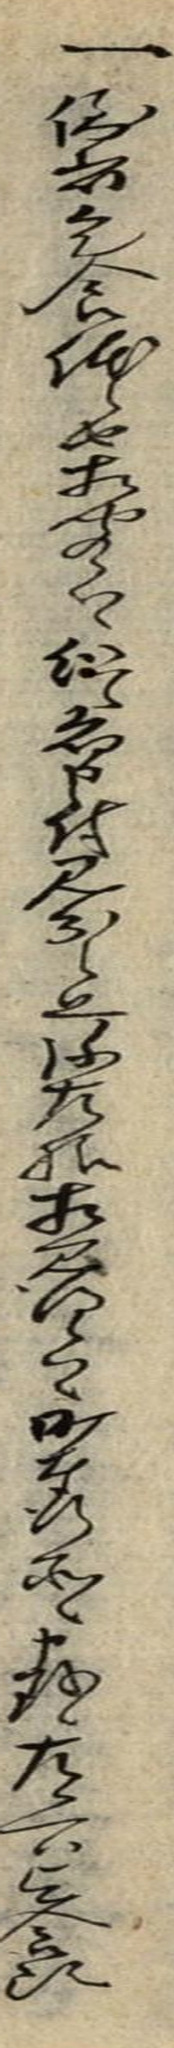一倒者乞食体之由相聞候はゝ組之者申付見分之上弥左様相見得候はゝ町奉行所へ申越候左候へは乞食頭
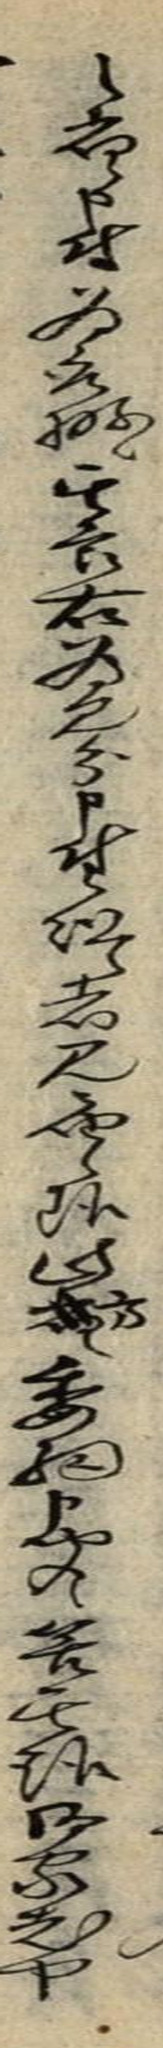之者へ申付為取扱候其節右為見分申付候組之者見届候趣此方へ委細申聞候筈其趣御家老中
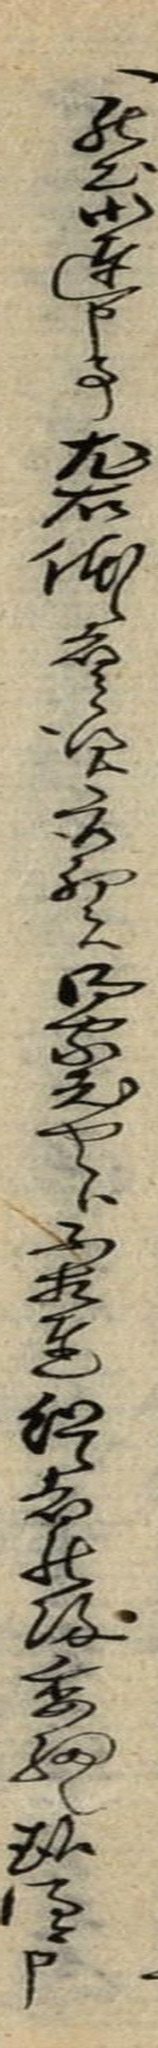へ罷出御達申事尤右体之者に候得は最初には御家老中へは不相達組之者罷帰委細之趣得と申
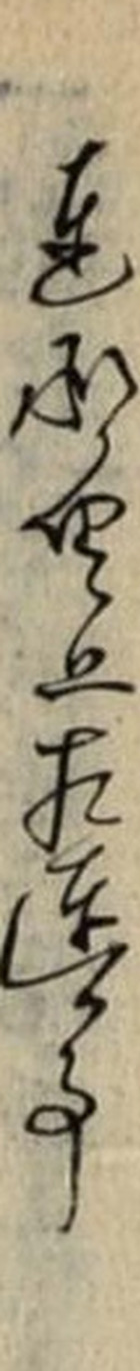達承届候上相達候事
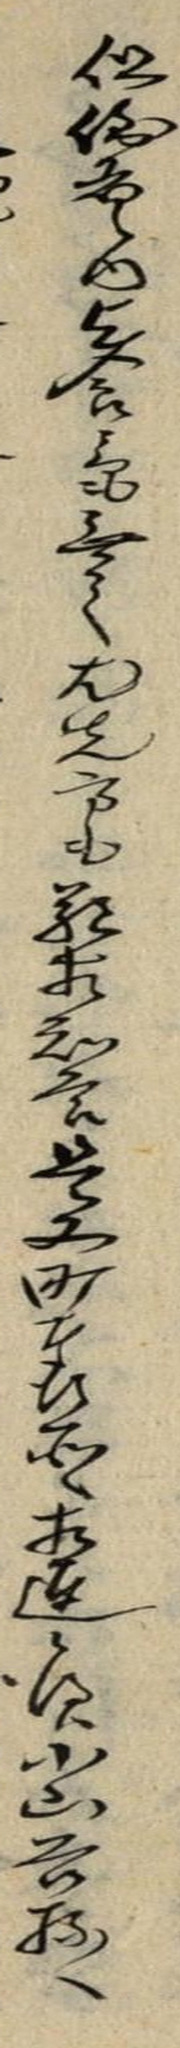但倒者之内乞食にても無之尤先方も難相知節是又町奉行所へ相達候得は小山谷抔へ
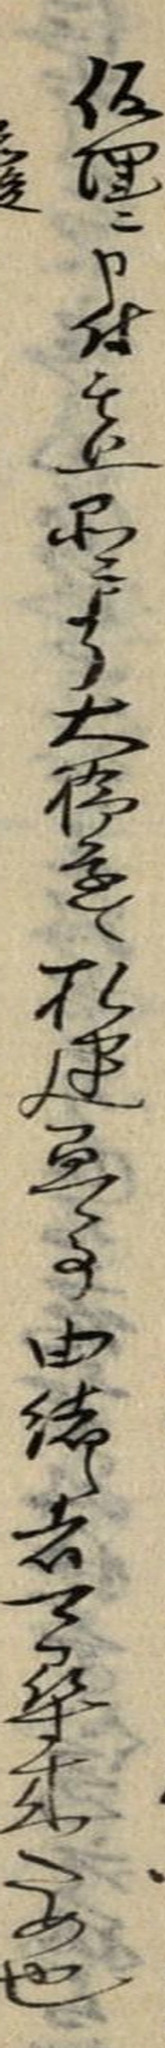仮埋に申付其上品により大橋辺へ札建置候事由緒之者可尋来ため也
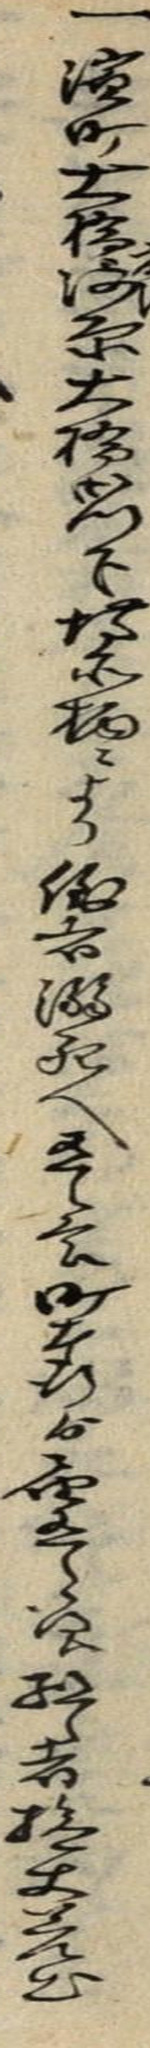一浜町大橋◦前後河原大橋御門下場所柄により倒者溺死人有之節町奉行ゟ届有之候得は組之者検使差出
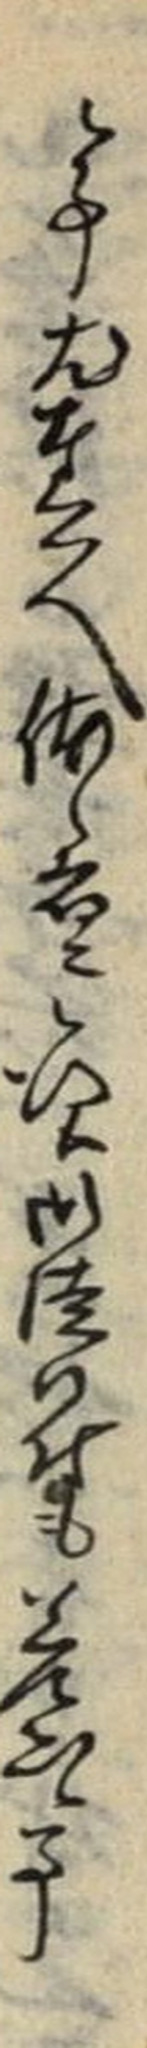候事尤奉公人体之者に候得は御徒目付も差出候事
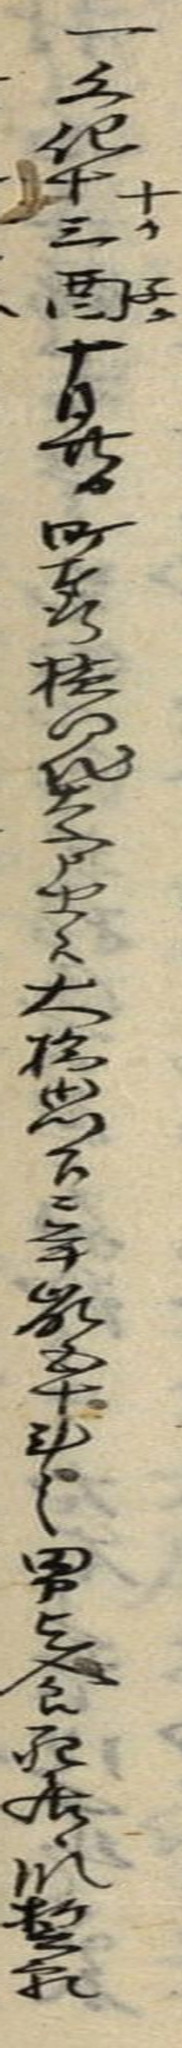一文化十三酉十月廿日町奉行横田作大夫申聞候は大橋御門下に年齢五十斗之男乞食死居候段誓願
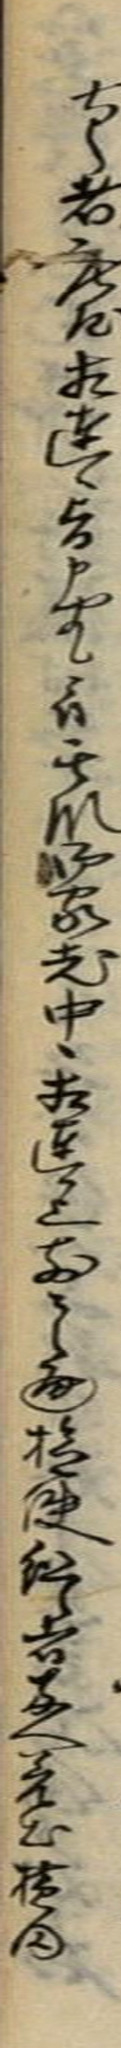寺之者庄屋相達候旨申聞候に付其段御家老中へ相達候上前々之通検使組之者両人差出横田
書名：御停止異変死失
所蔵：福井県文書館 Fukui Prefectural Archives
